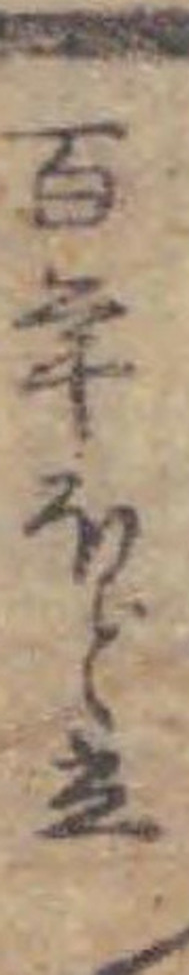百年ほど立
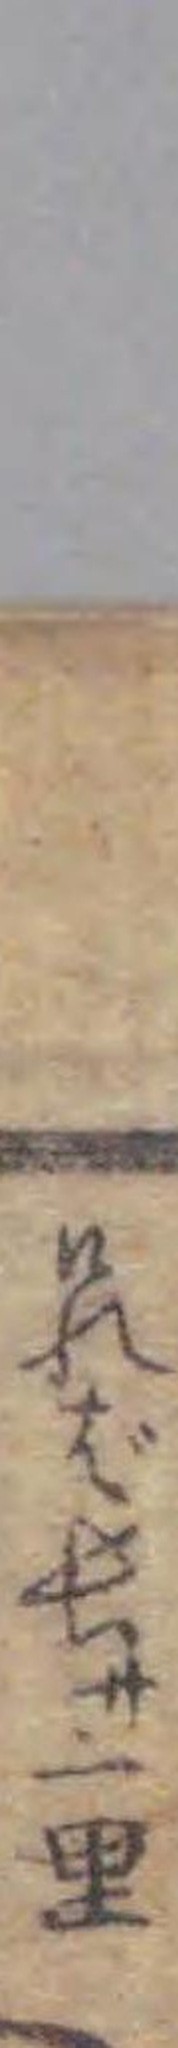ければ長一里
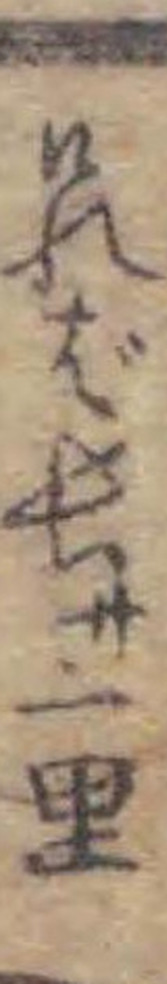ければ長一里
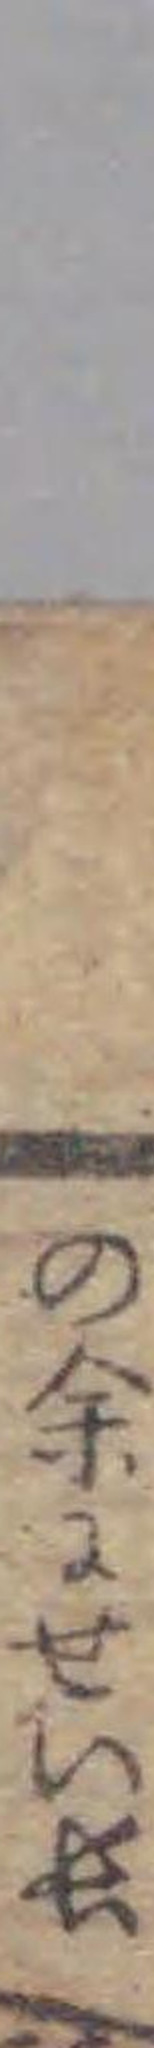の余にせい長
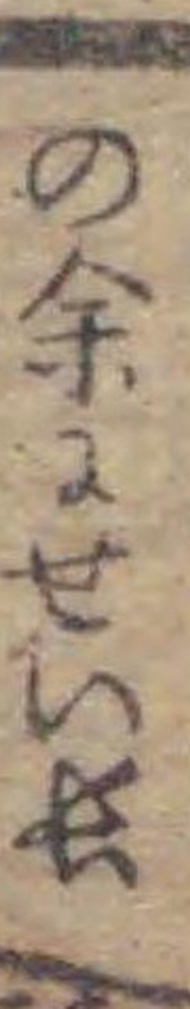の余にせい長
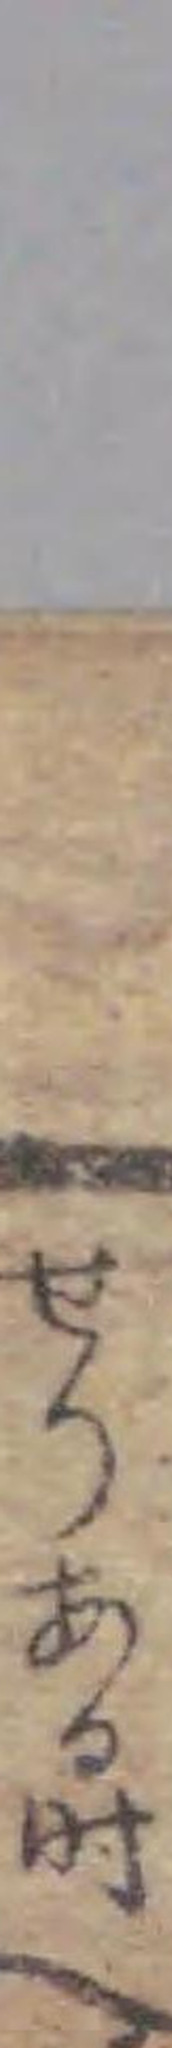せりある時
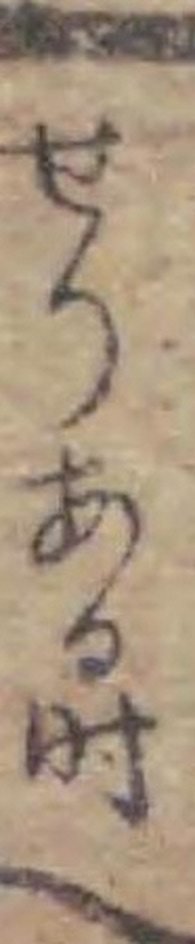せりある時
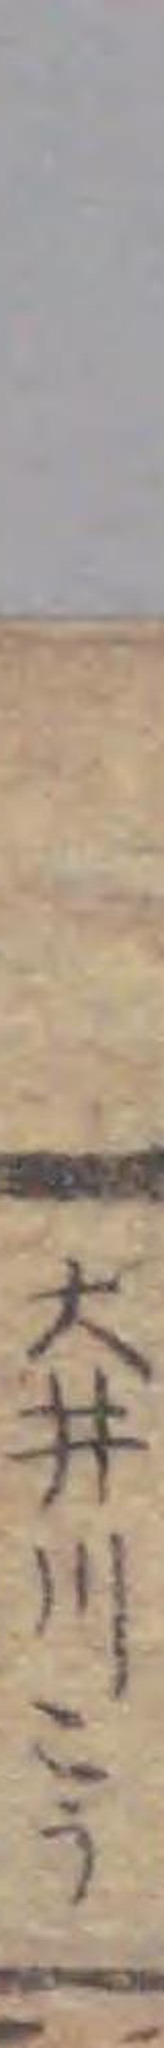大井川こう
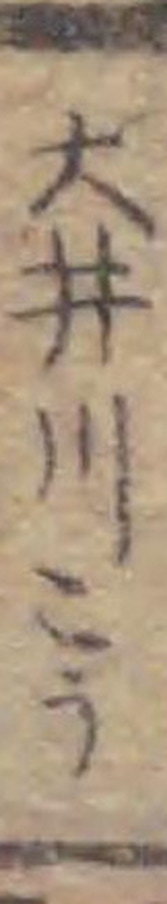大井川こう
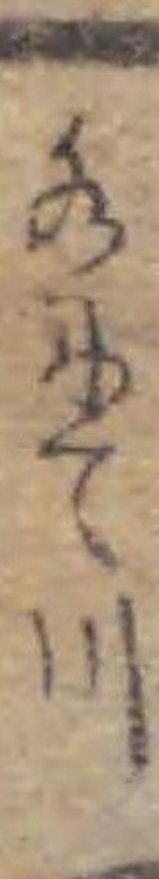水にて川
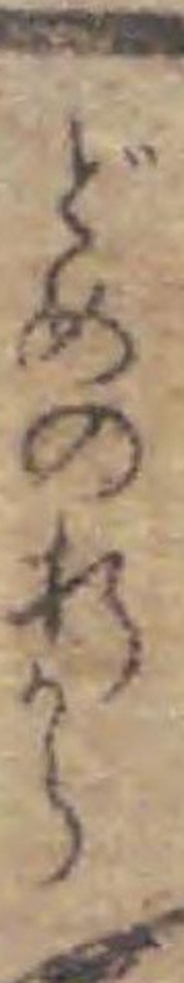どめの折から
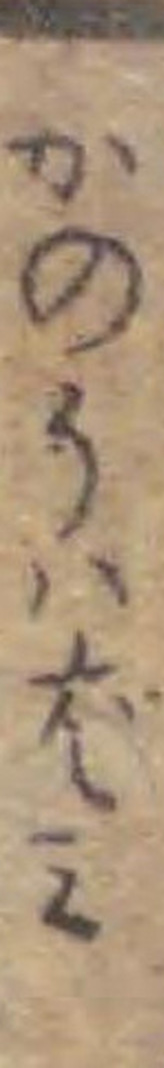かのうはばみ
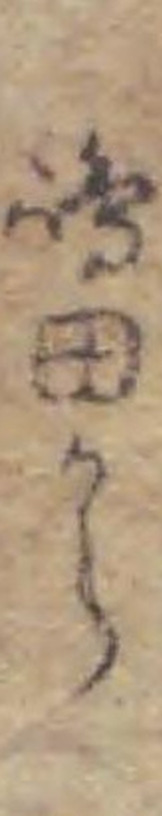島田から
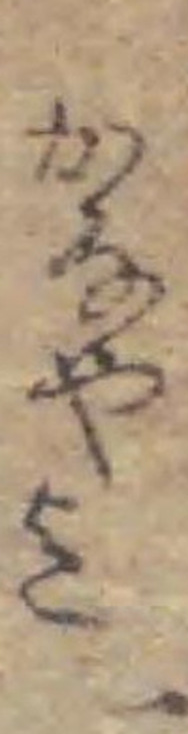かなや迄
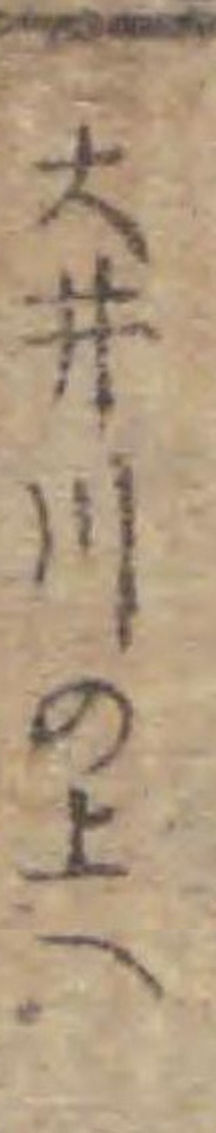大井川の上へ
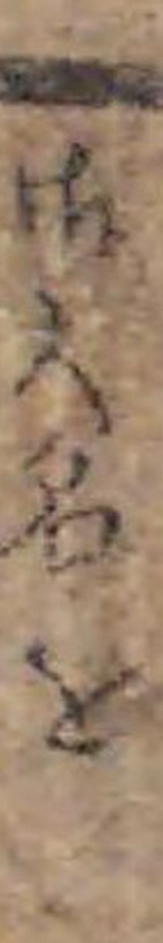御大名を
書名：虚言八百万八伝 : 3巻
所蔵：国立国会図書館 National Diet Library, JAPAN
